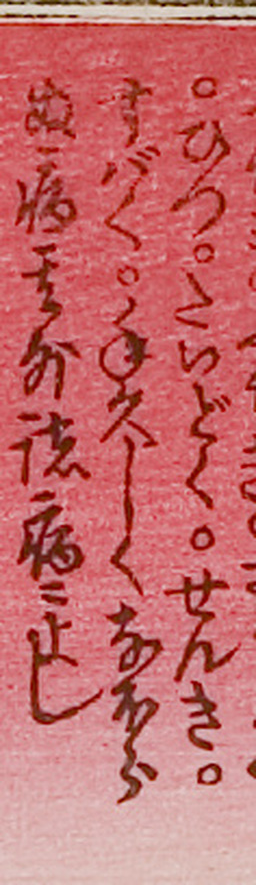すばく○年久しくなほら
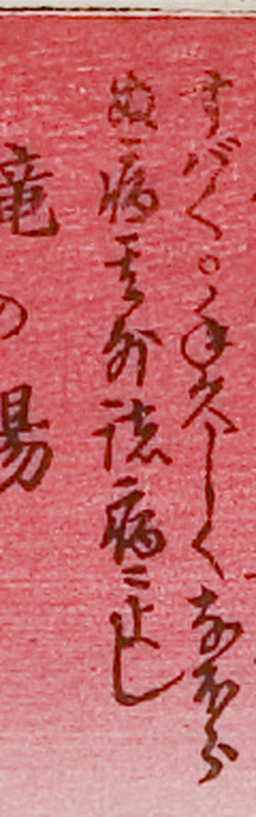ぬ病其外諸病によし
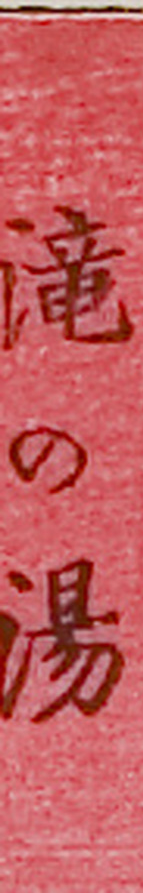滝の湯
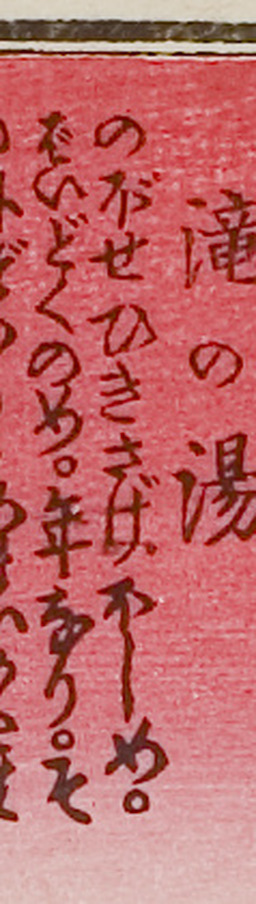のぼせひきさげほしめ○
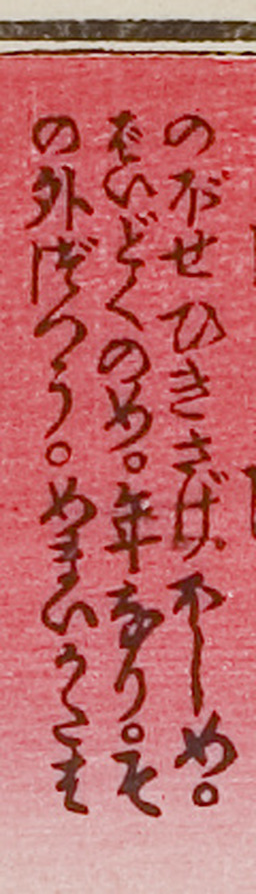ばいどくのめ○年なり○そ
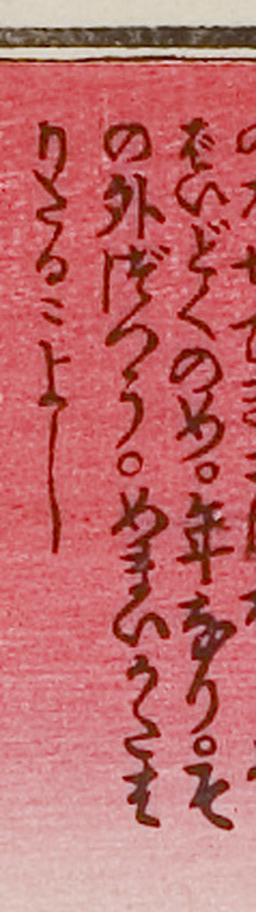の外づつう○めまいかたは
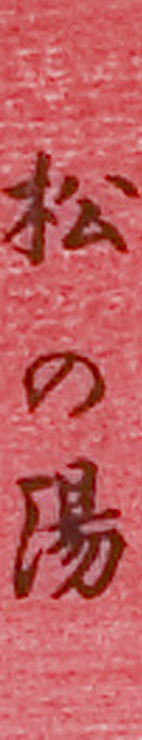松の湯
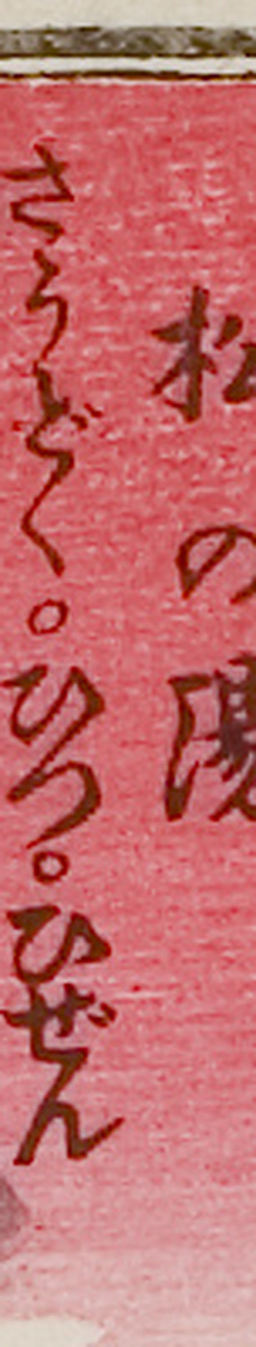さうどく○ひつ○ひぜん
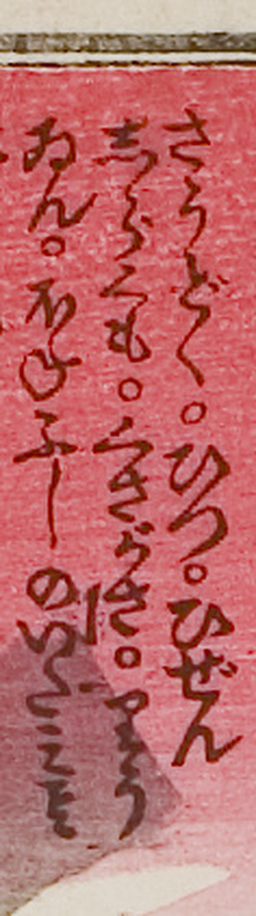しらくも○くさがさ○りう
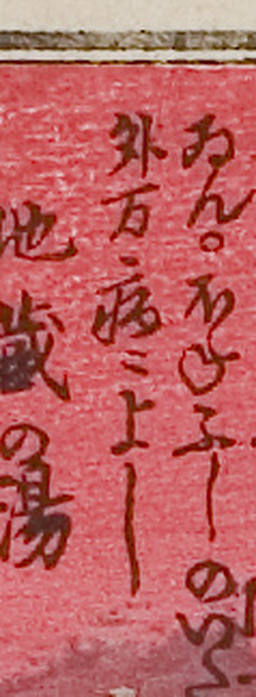外万病によし
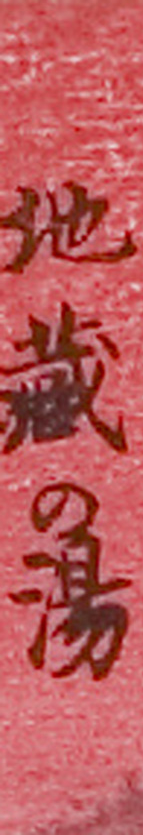地蔵の湯
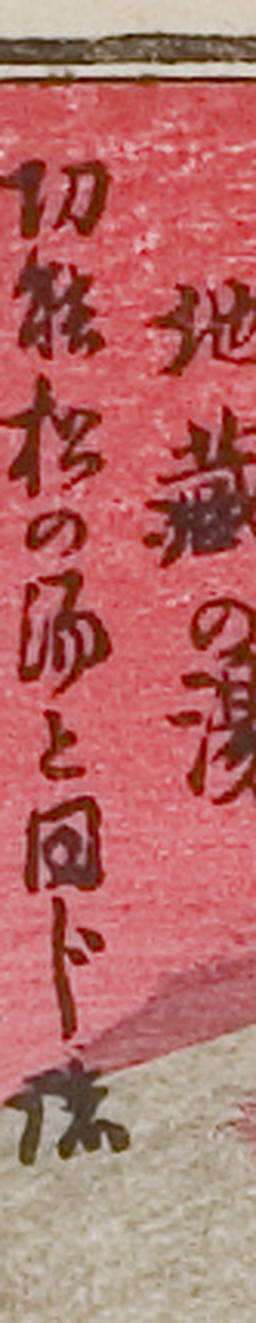功能松の湯と同じ諸
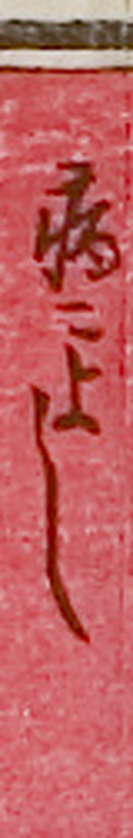病によし
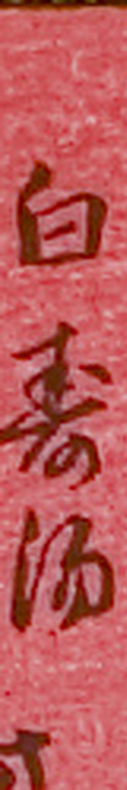白寿湯
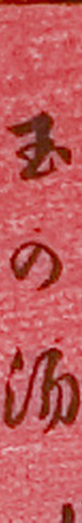熱の湯
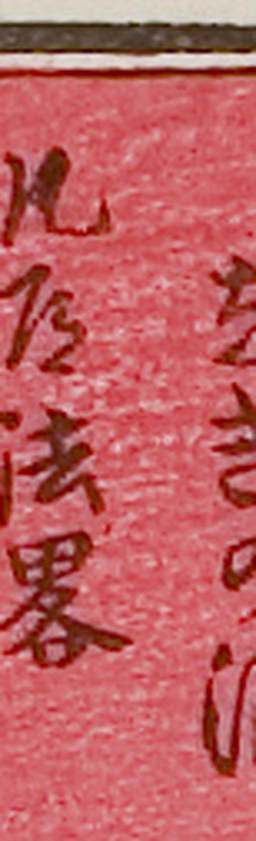凡道法略
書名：上州草津温泉之全図
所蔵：東京大学総合図書館 General Library in the University of Tokyo, JAPAN
